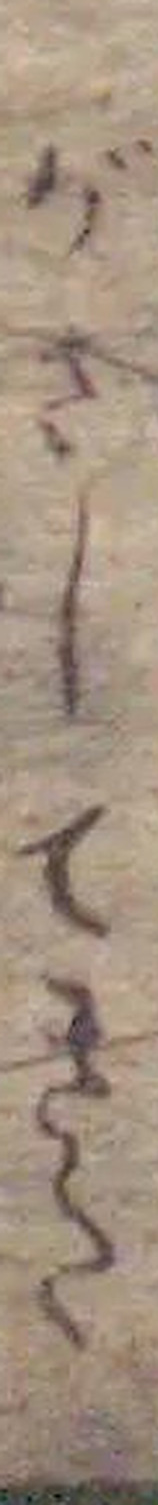がさしてきた
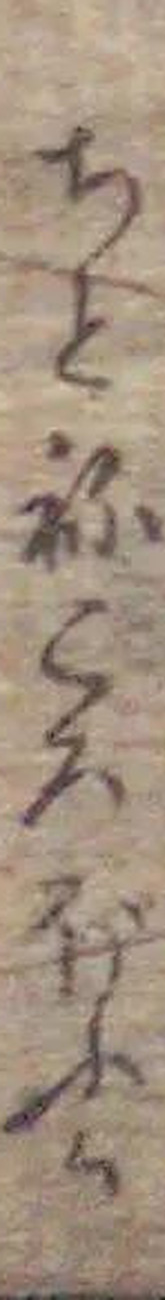ちとねころぼふか

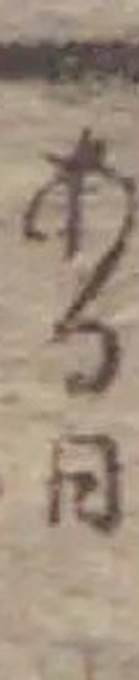ある日
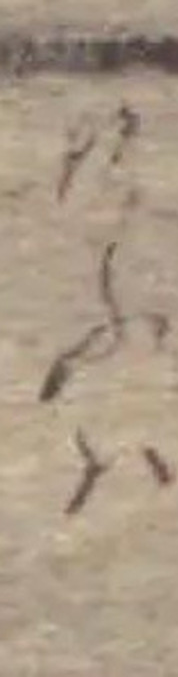けふは
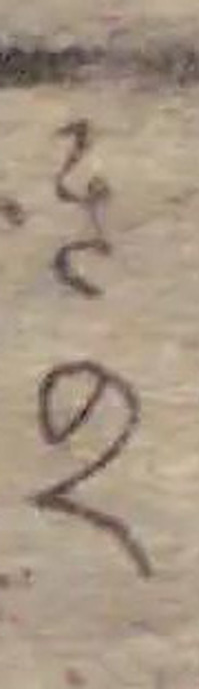きのへ
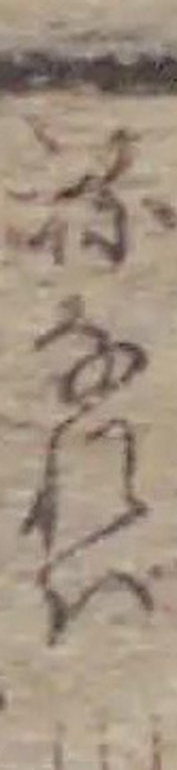ねなれば
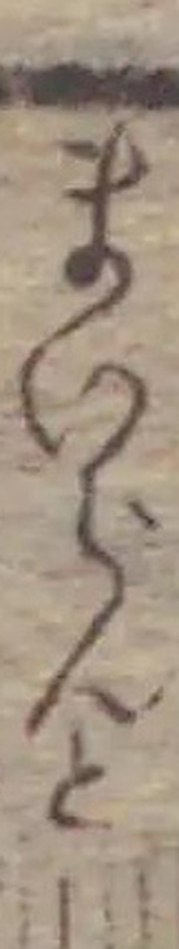まいらんと
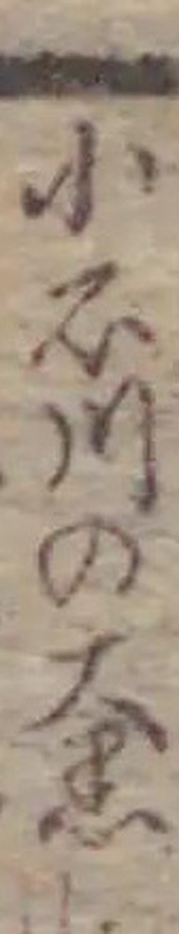小石川の大黒
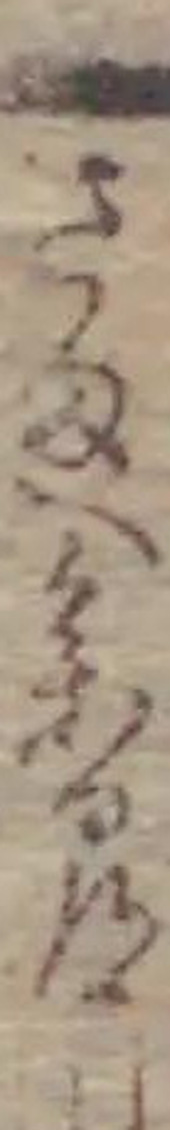さまへ参る道
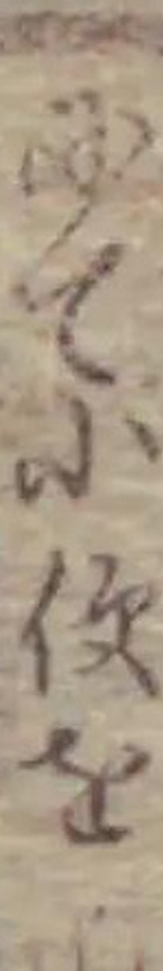にて小便を
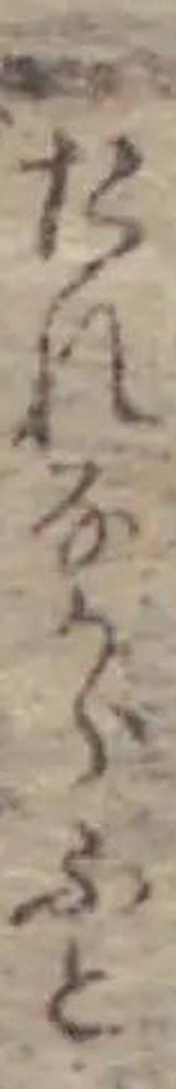たれなからふと
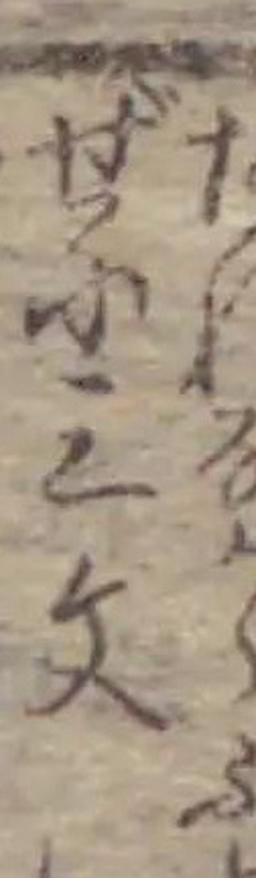ぜに三文
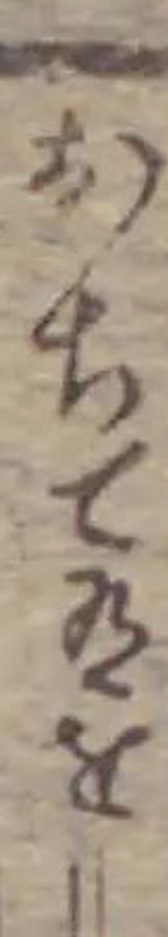おちて有を
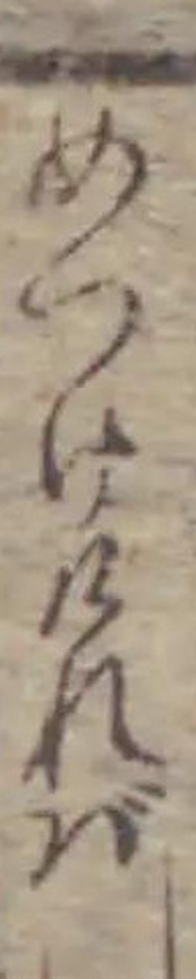めつけければ
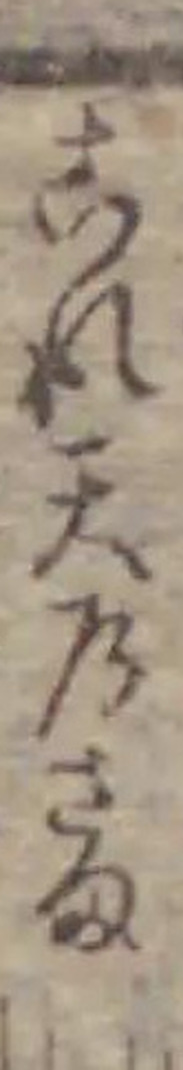これ天道さま
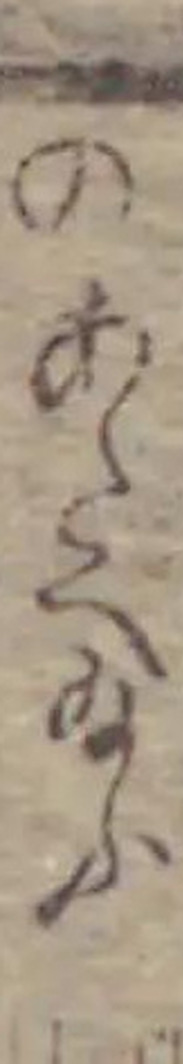のあたへ給ふ
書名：栄増眼鏡徳 3巻
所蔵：国立国会図書館 National Diet Library, JAPAN
